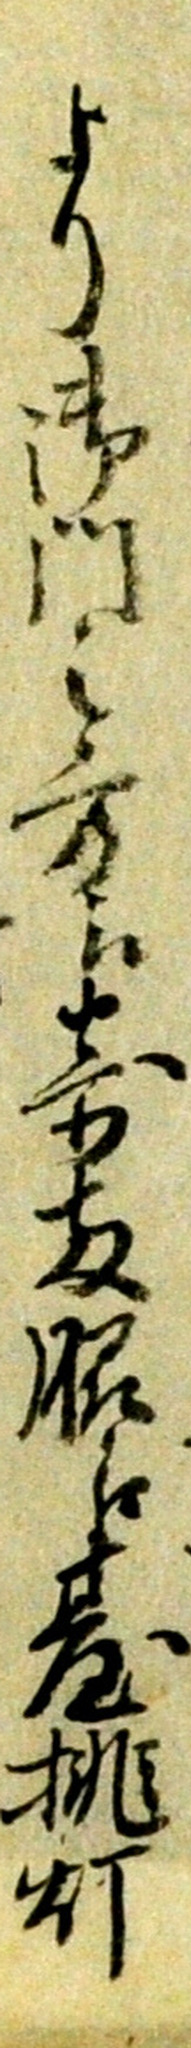より御門之方江寄両脇江台挑灯
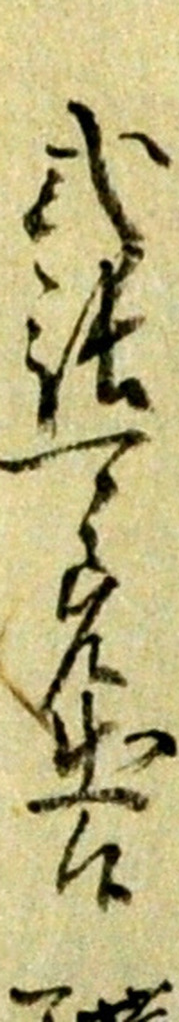張可差出候事
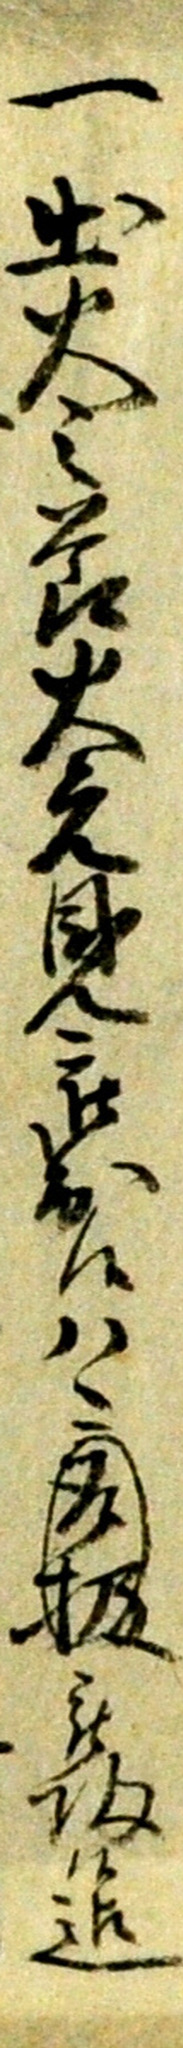一出火之節火元見被出候ハヽ取扱被帰候迄
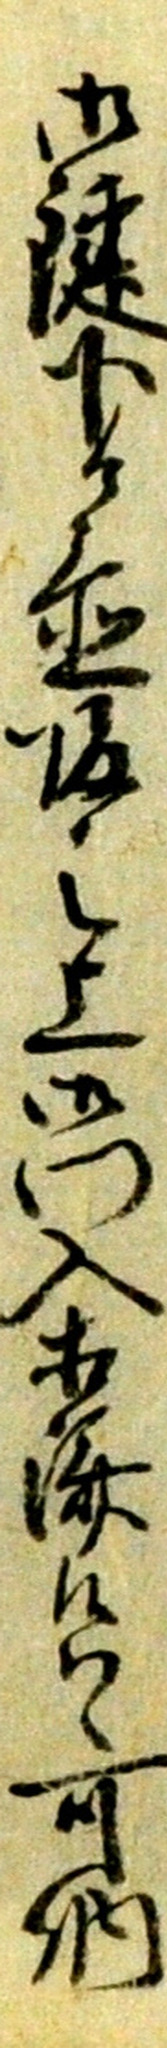御鍵下ケ置帰之上御門入相済候ハヽ可納
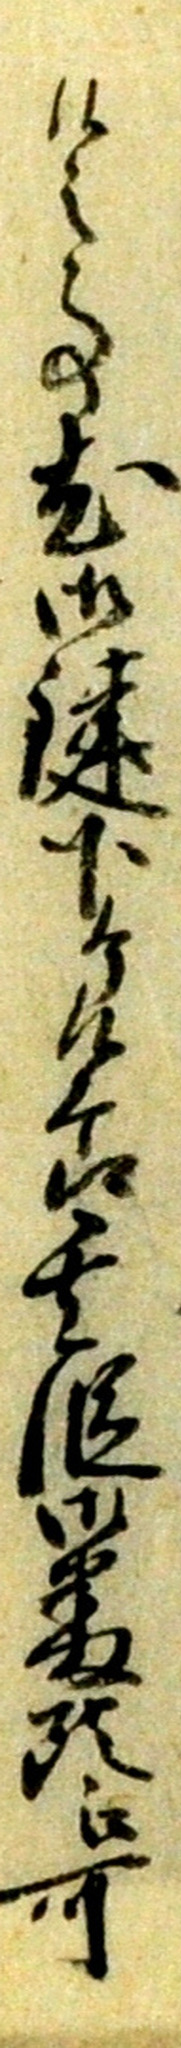候之事尤御鍵下ケ候節其段御番頭江可
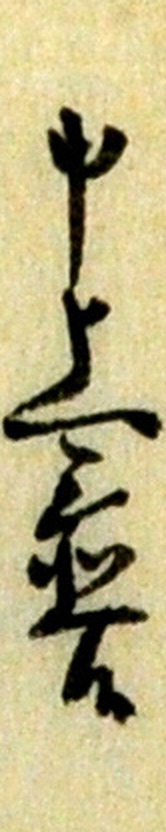申上置候
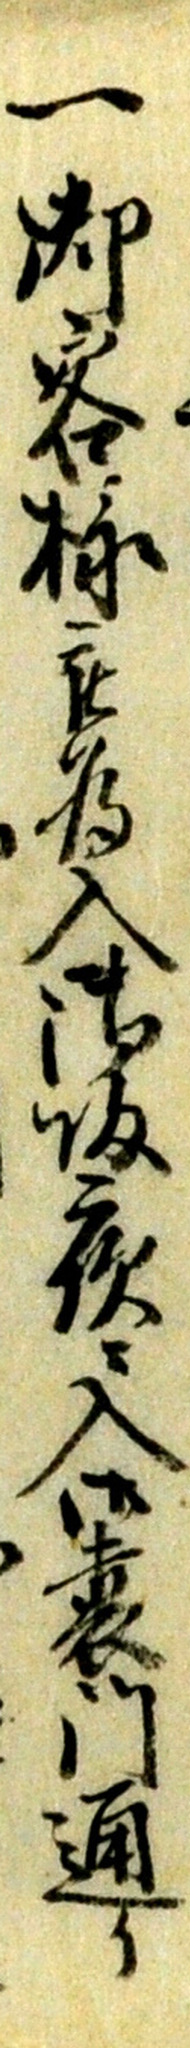一御客様被為入御帰夜ニ入御裏門通り
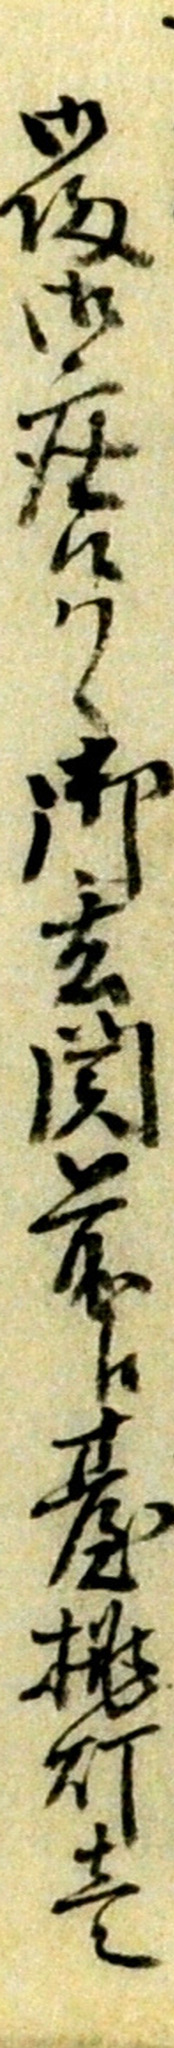御帰御座候ハヽ御玄関前江台挑灯壱
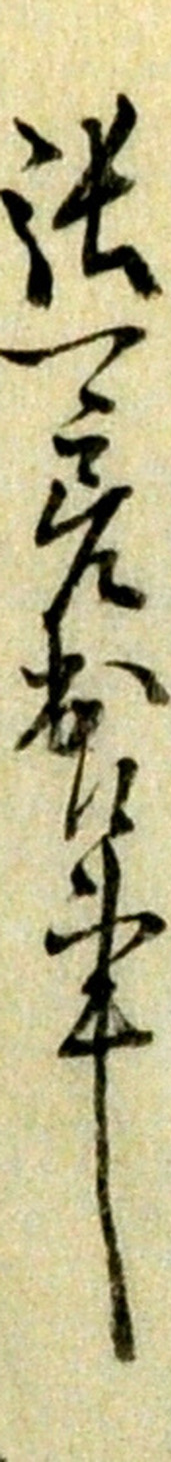張可差出候事
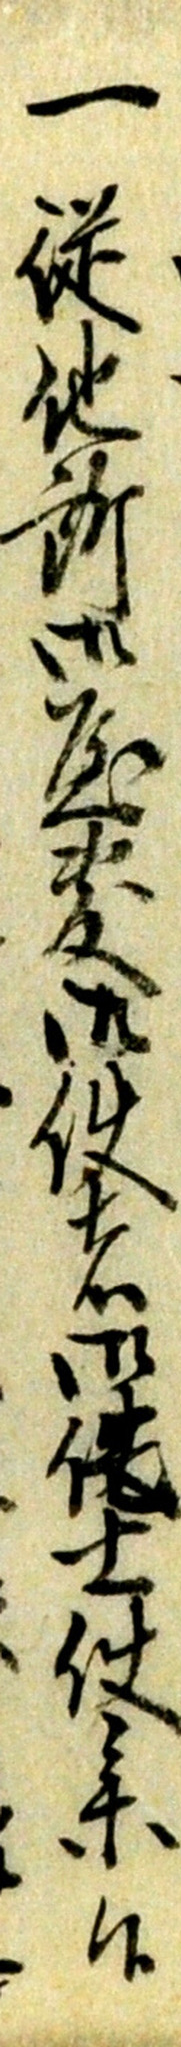一従他所御屋敷御使者御徒士使参候
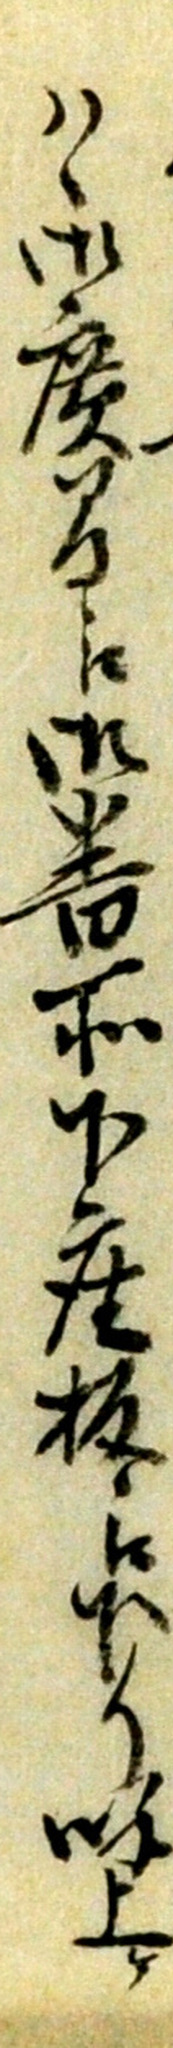ハヽ御広間江御番所下座板江下り呼上け
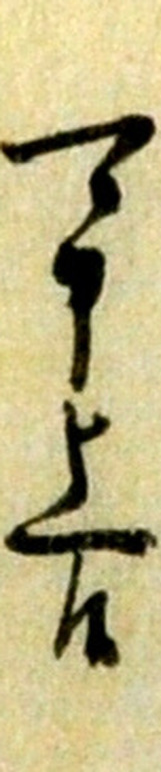可申上候
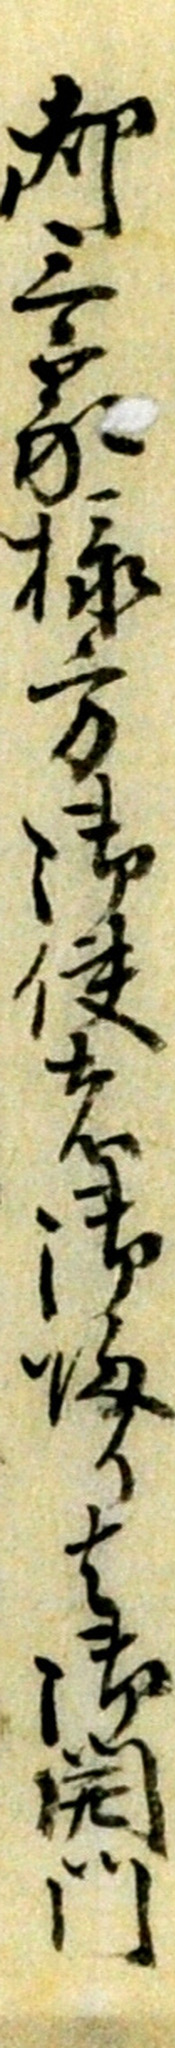御三家様方御使者御帰り者御開門
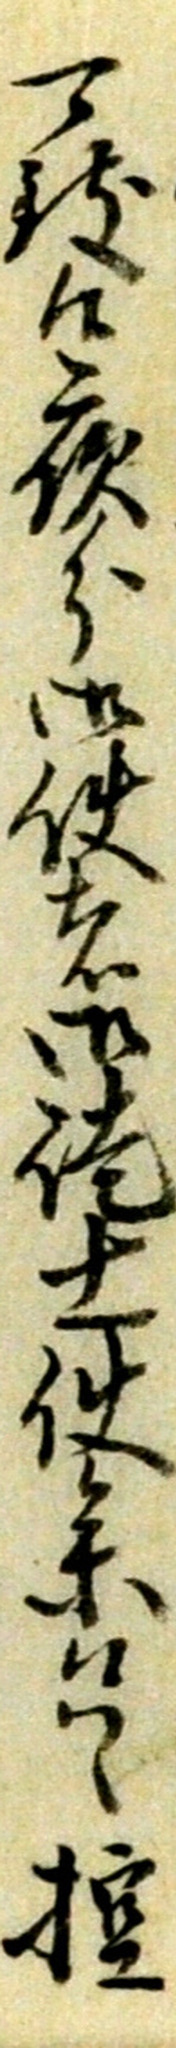可致候夜分御使者御徒士使参候ハヽ控
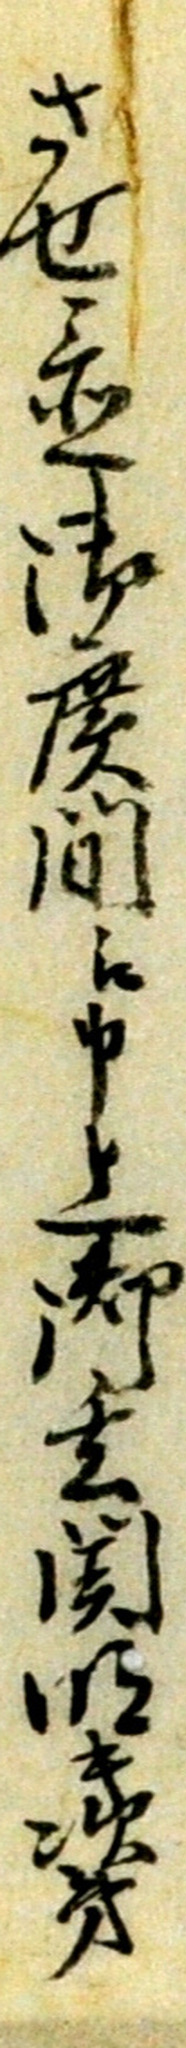させ置御広間江申上御玄関明キ次第
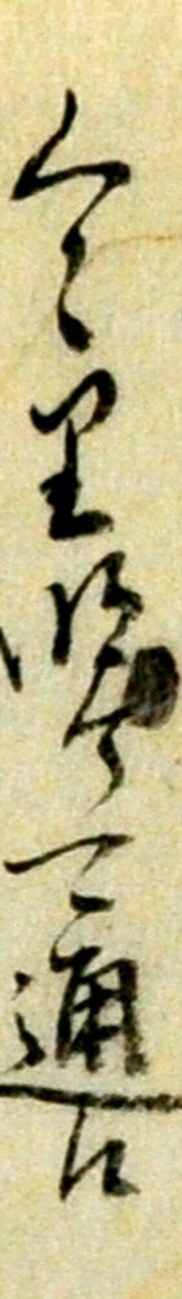くヽり明ケ可通候
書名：御先手組江戸御屋敷御門番勤方
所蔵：伊那市立高遠町図書館・合同会社AMANE
